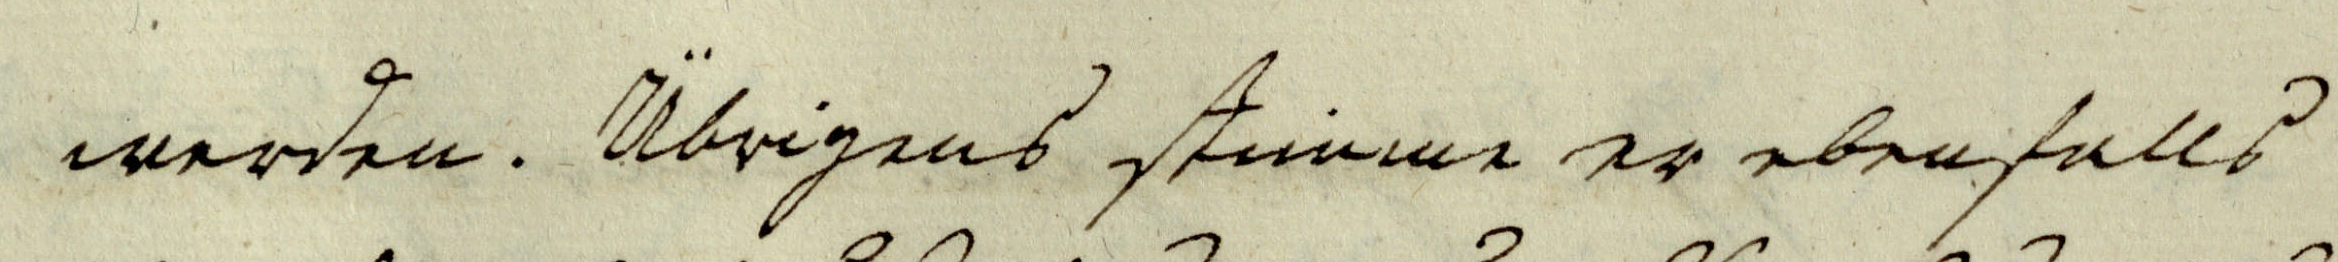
werden. Übrigens stimme er ebenfalls
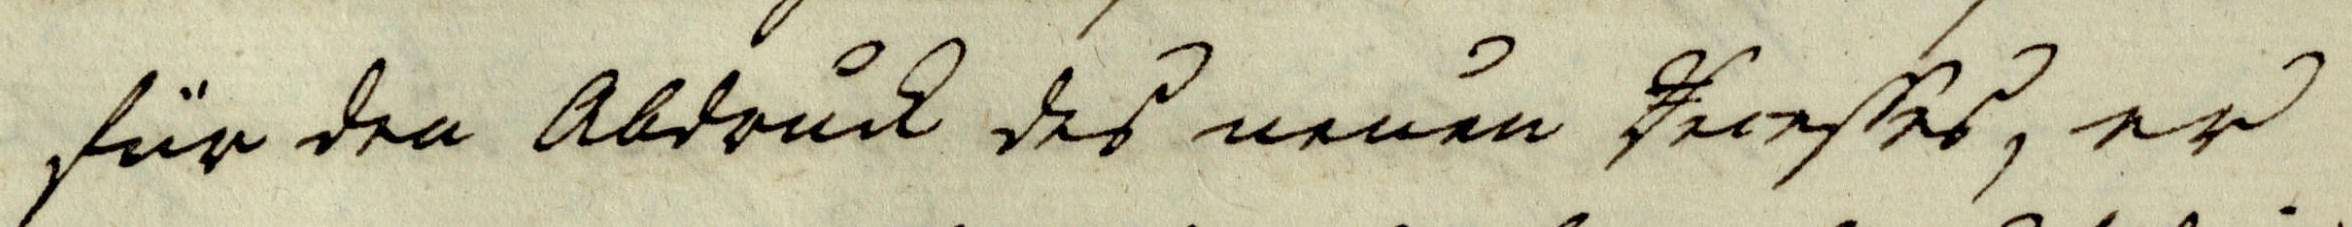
für den Abdruck des neuen Recesses, er
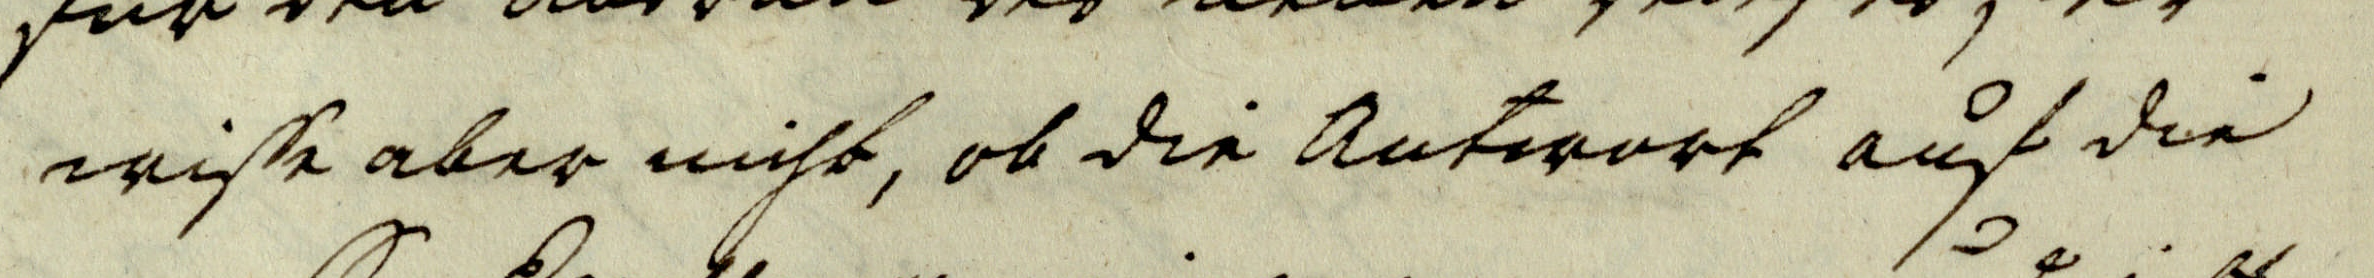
wisse aber nicht, ob die Antwort auf die
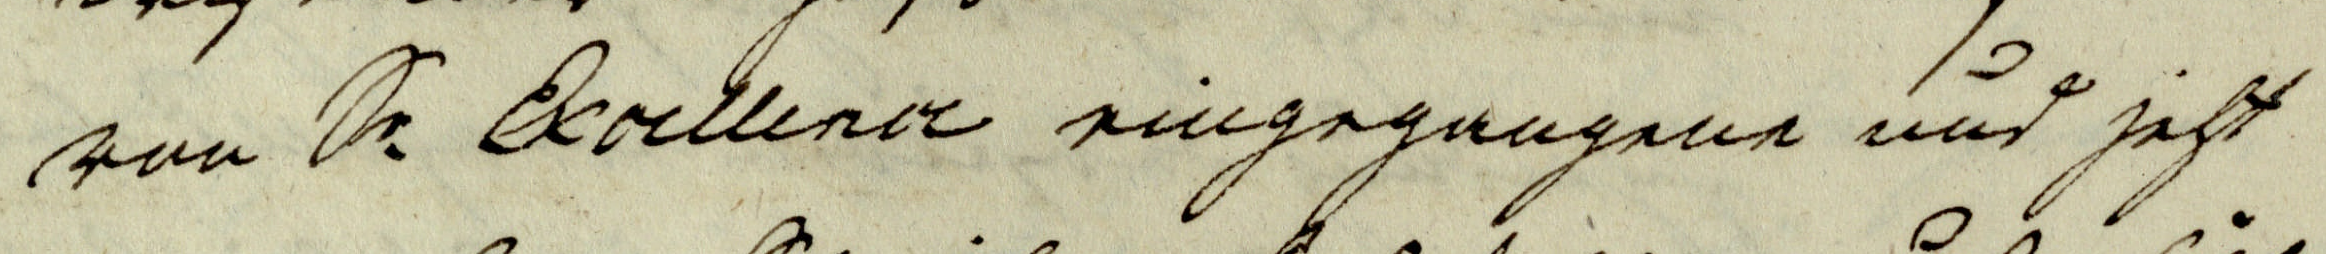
von Sr Excellence eingegangene und jetzt
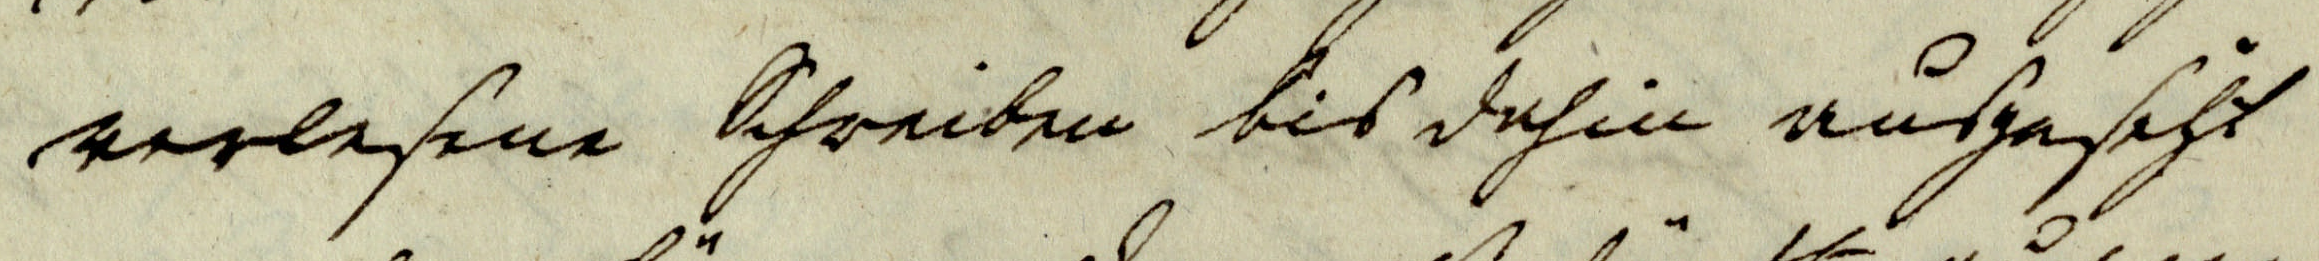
verlesene Schreiben bis dahin ausgesetzt
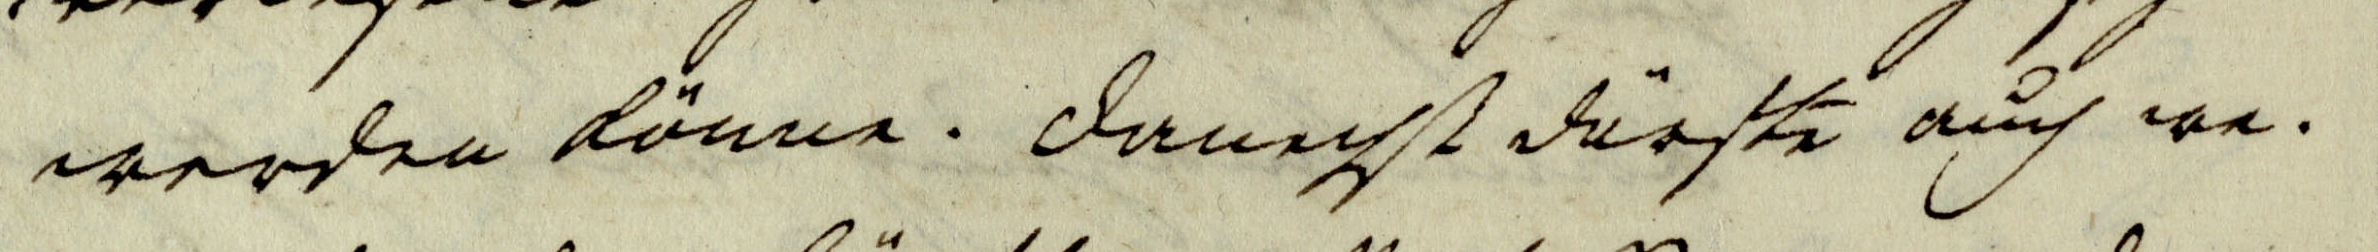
werden könne. Danechst dürfte auch we¬
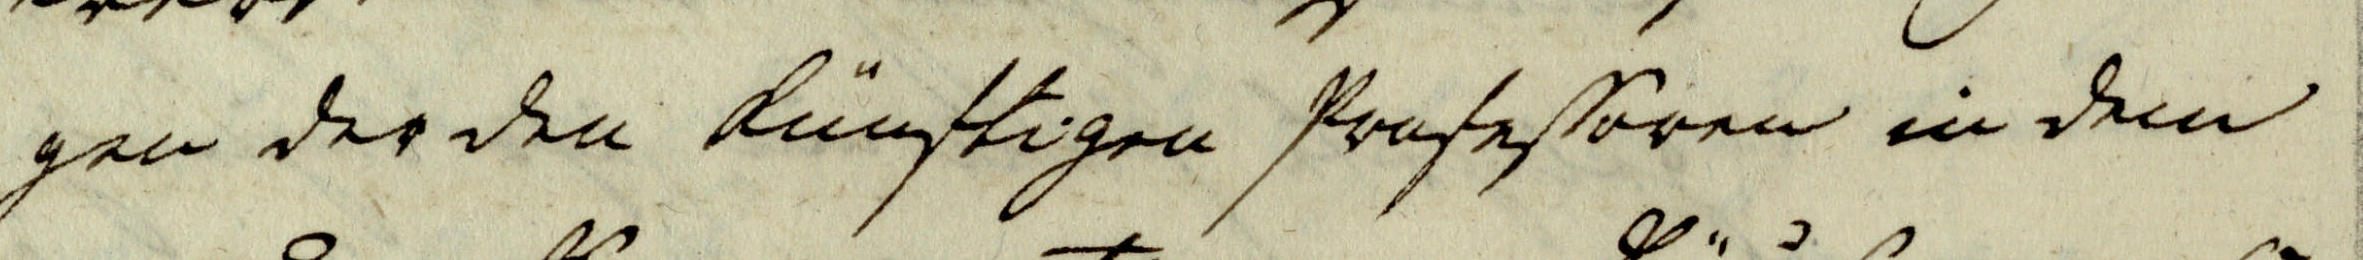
gen der den künftigen Professoren in dem
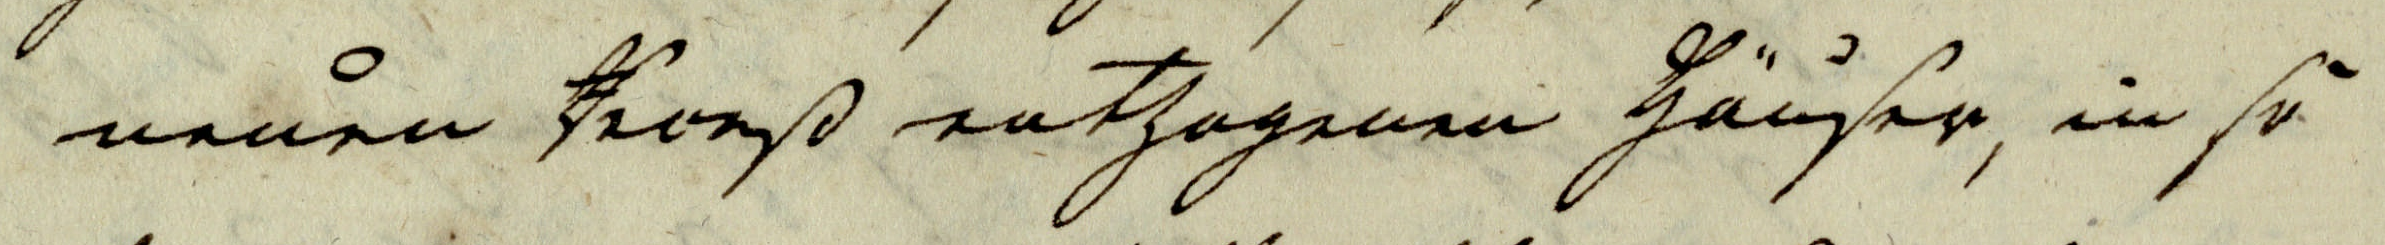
neuen Receß entzogenen Häuser, in so
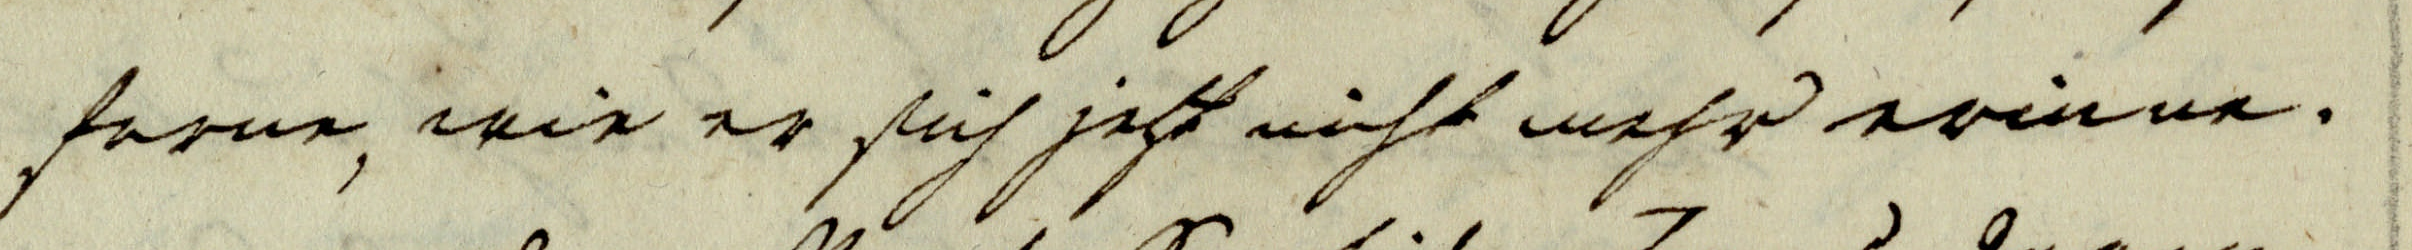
ferne, wie er sich jetzt nicht mehr erinne¬
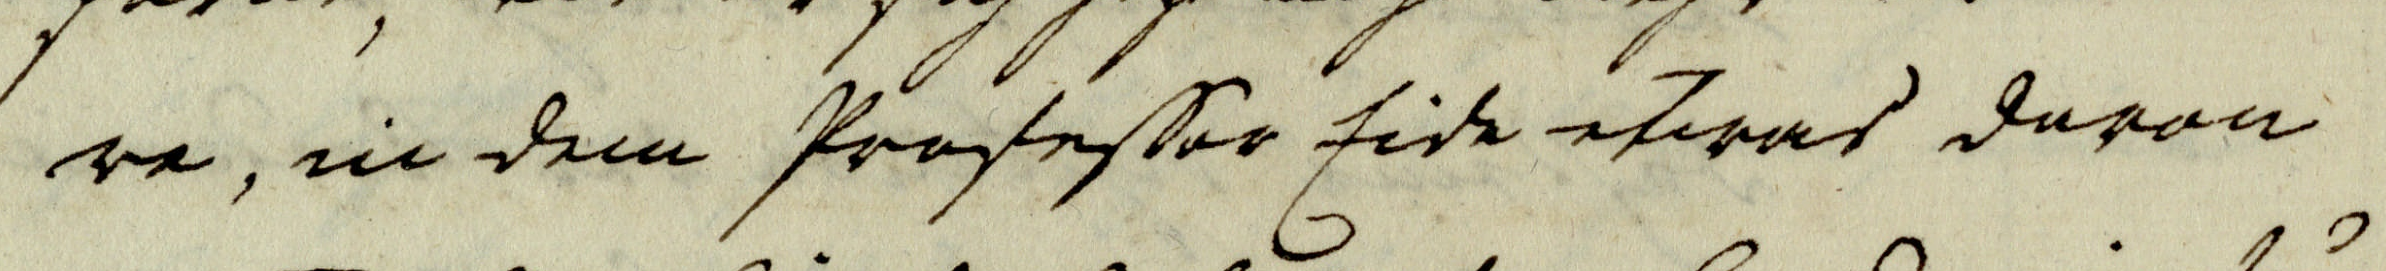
re, in dem Professor Eide etwas davon
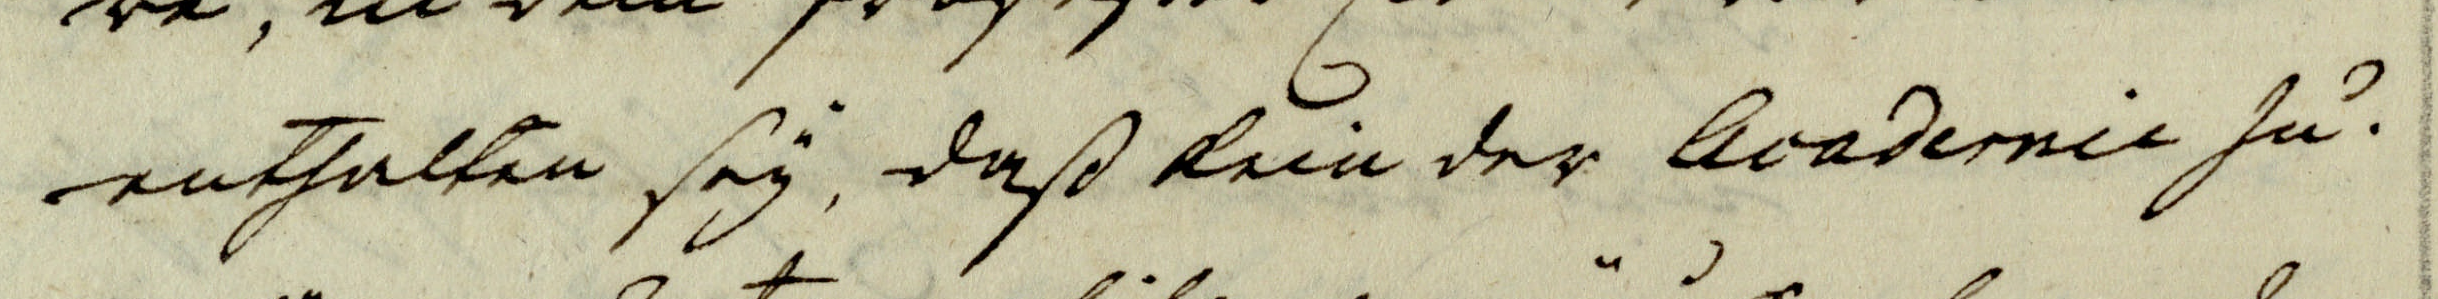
enthalten seÿ, daß kein der Academie zu¬
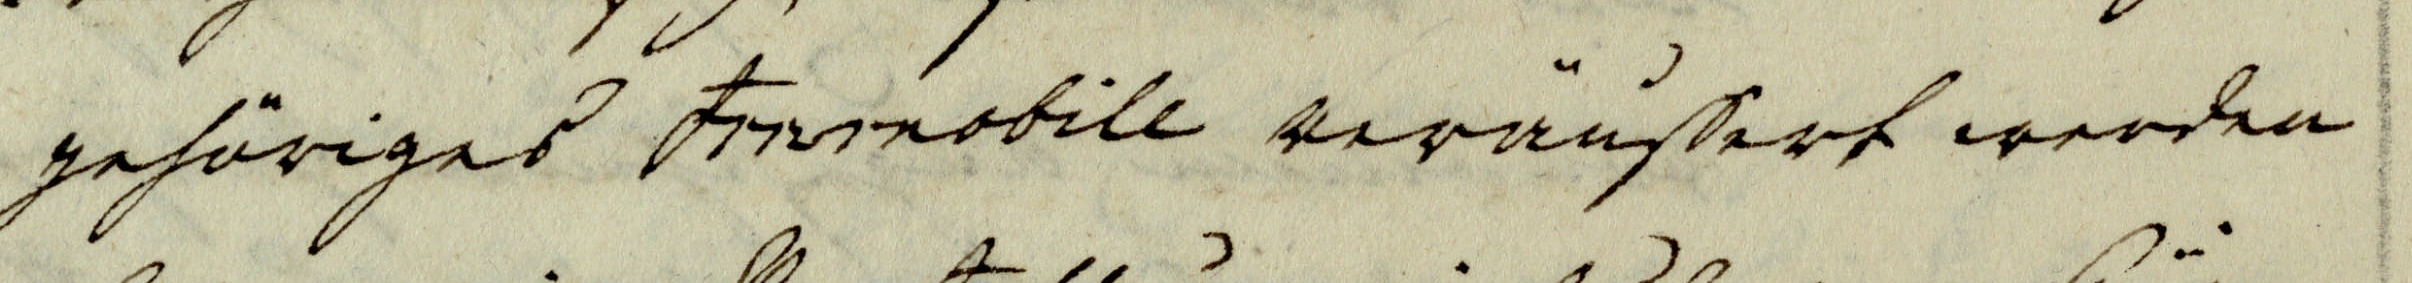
gehöriges Immobile veräussert werden
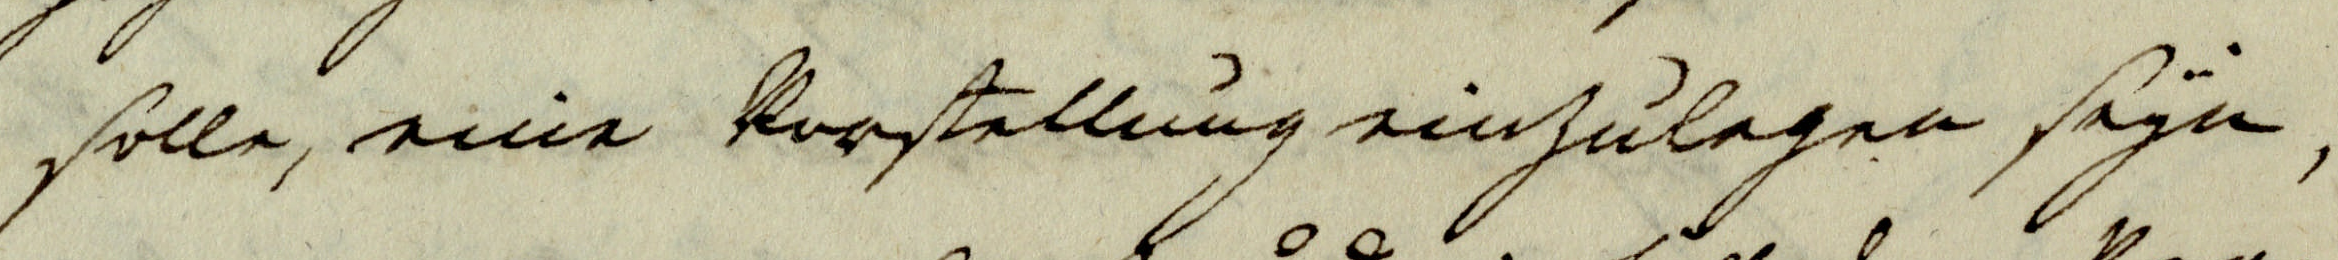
solle, eine Vorstellung einzulegen seÿn,
